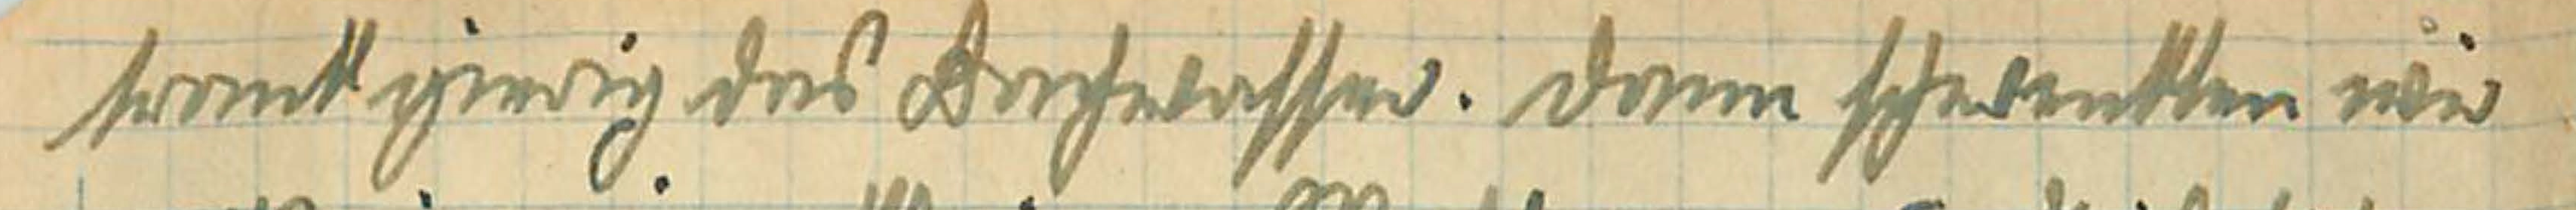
trank gierig das Bachwasser. Dann schwenkten wir
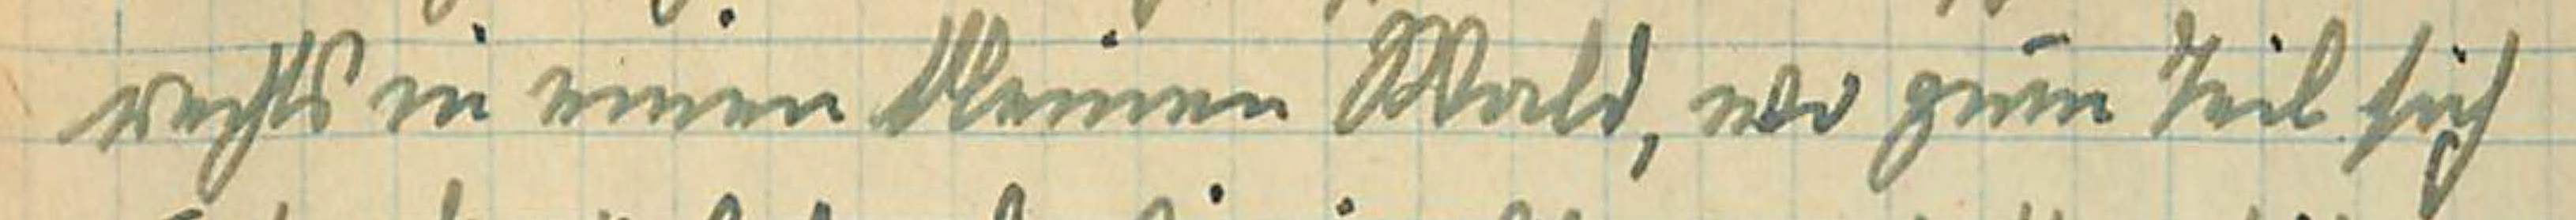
rechts in einen kleinen Wald, wo zum Teil sich
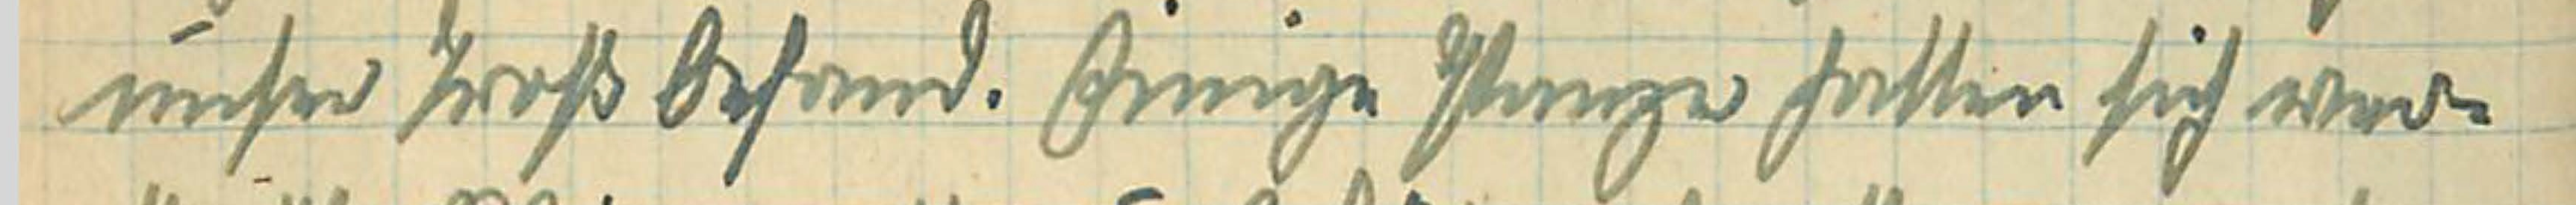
unser Troß befand. Einige Panzer hatten sich ver-
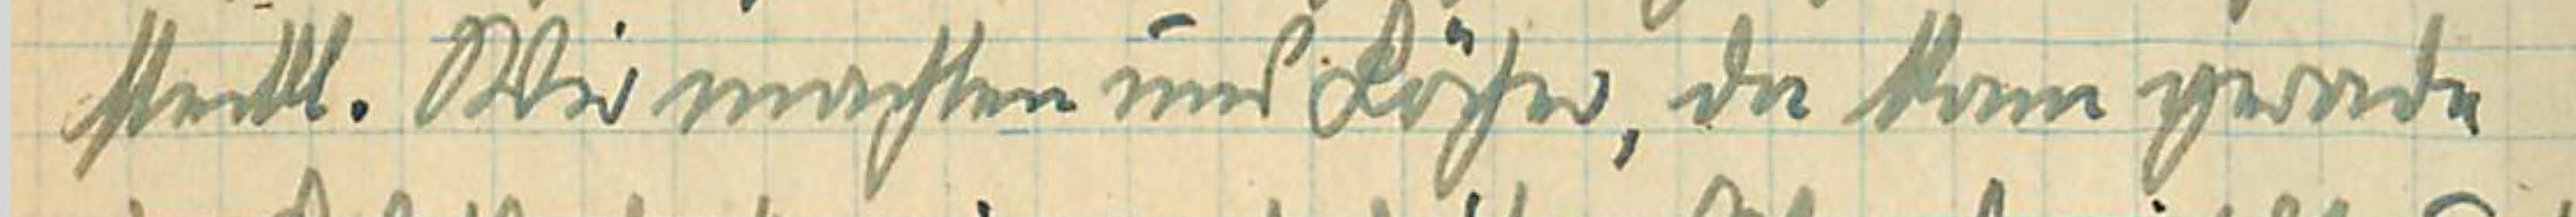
steckt. Wir machten uns Löcher, da kam gerade
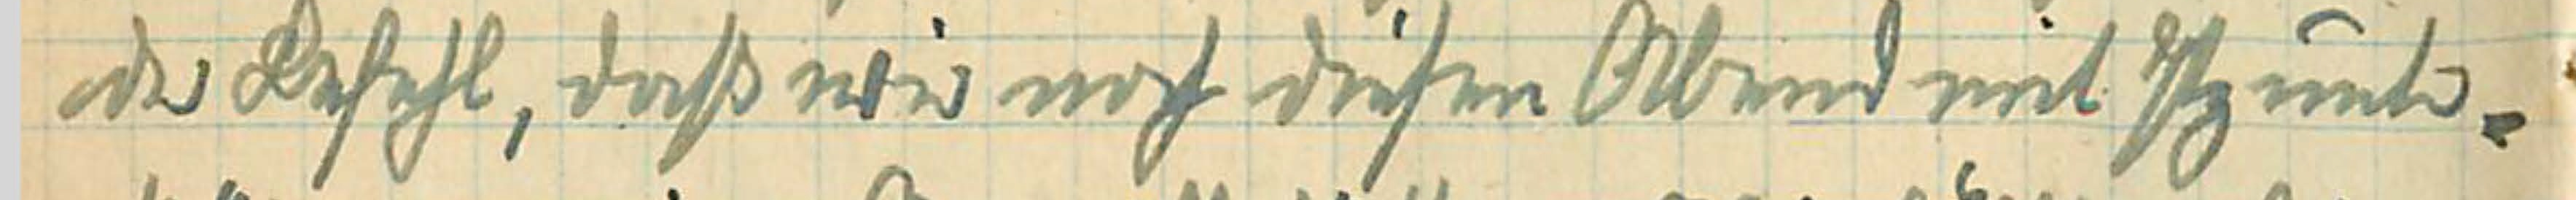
der Befehl, daß wir noch diesen Abend mit Pzunter-
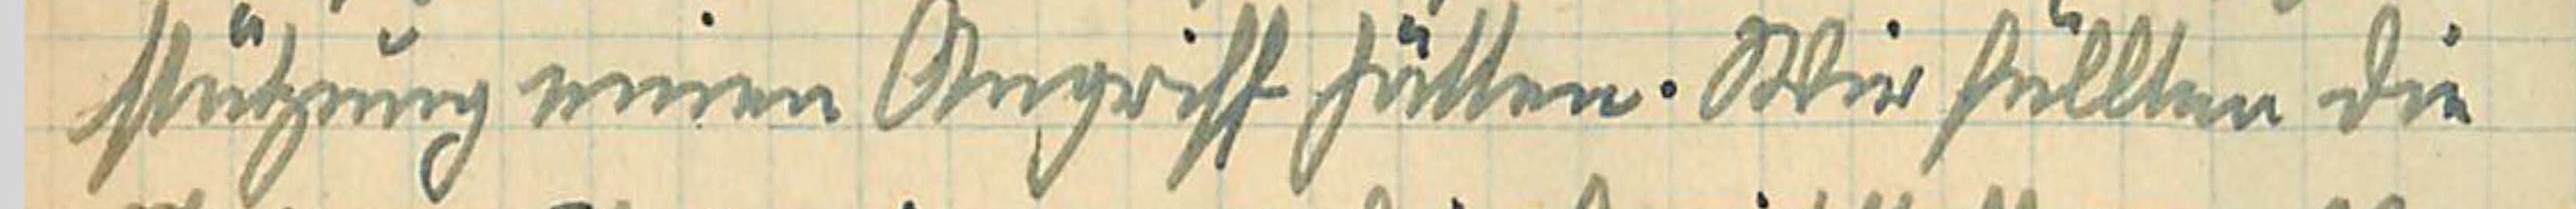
stützung einen Angriff hätten. Wir füllten die
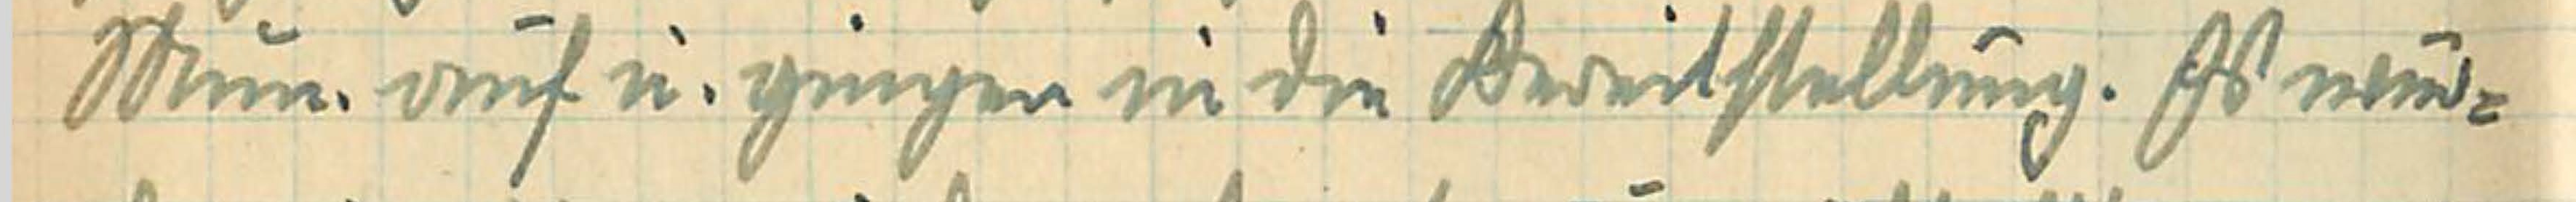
Mun. auf u. gingen in die Bereitstellung. Es wur-
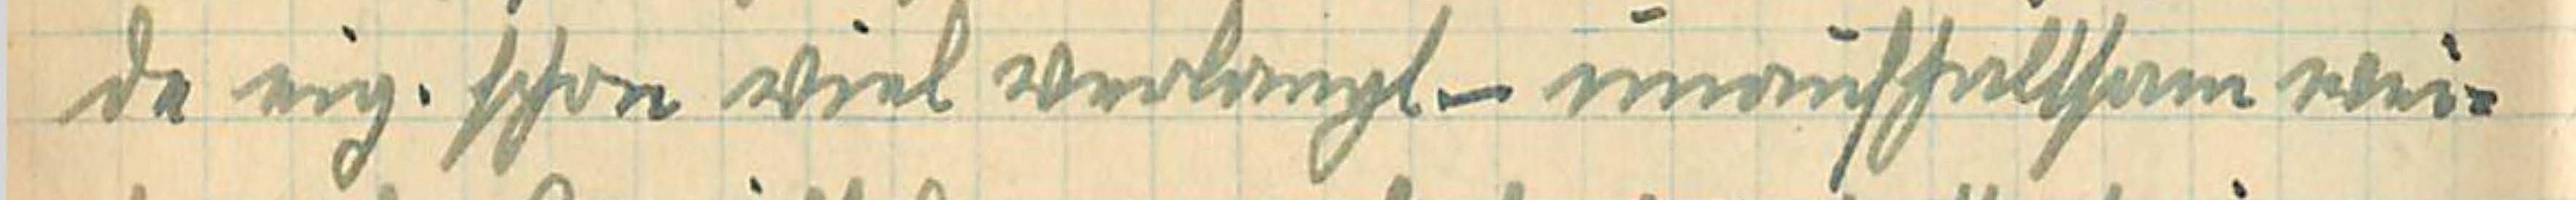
de eig. schon viel verlangt – unaufhaltsam wei-
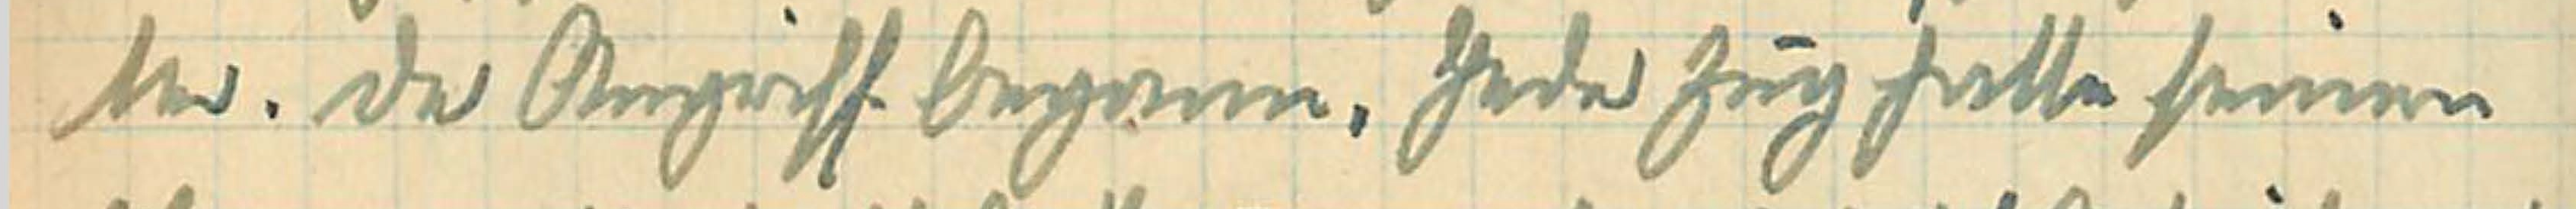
ter. Der Angriff begann. Jeder Zug hatte seinen
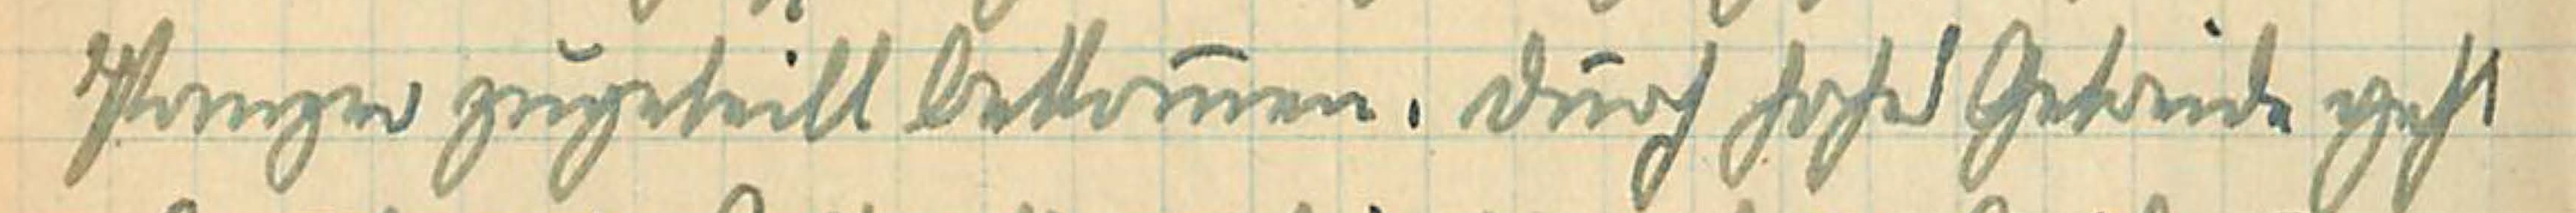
Panzer zugeteilt bekommen. Durch hohes Getreide geht
